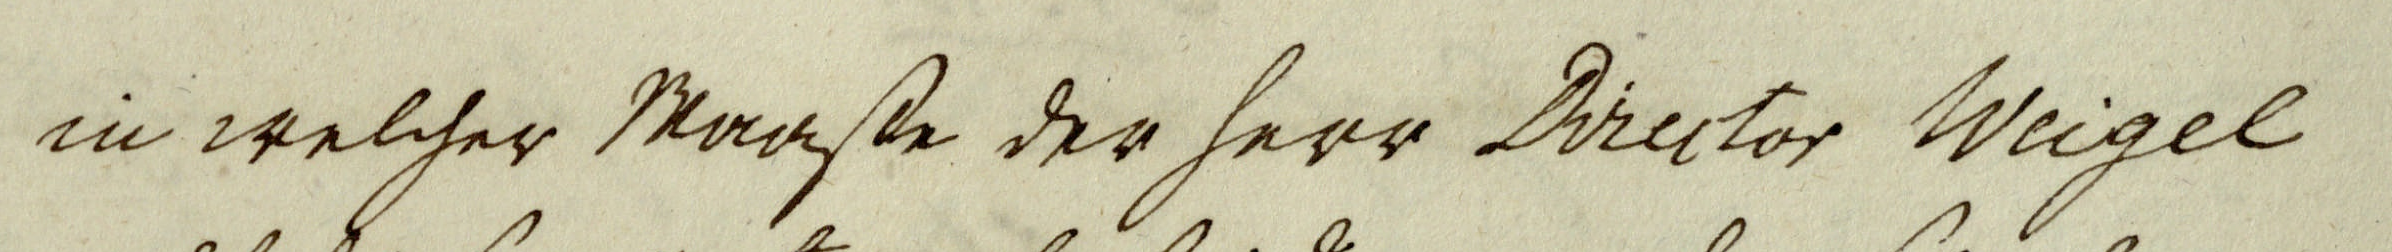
in welcher Maaße der Herr Director Weigel
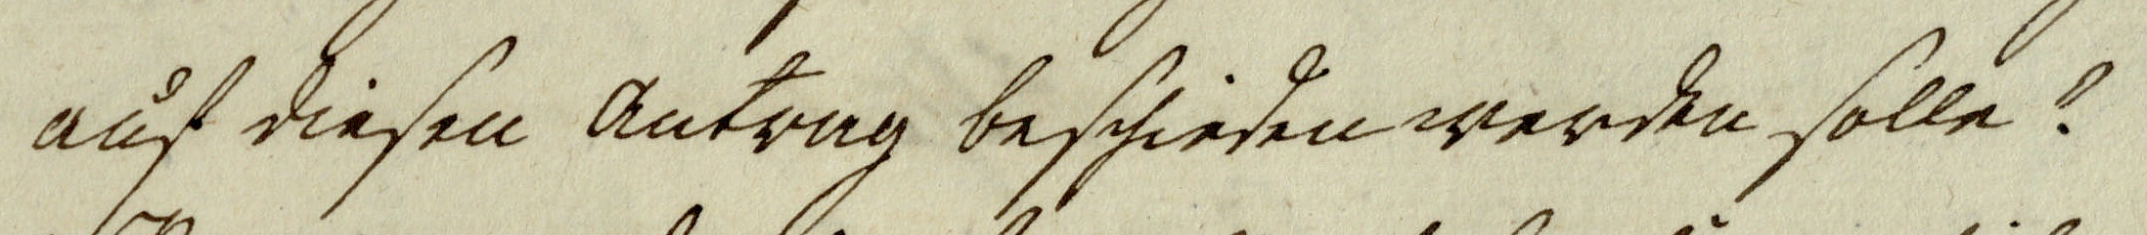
auf diesen Antrag beschieden werden solle?
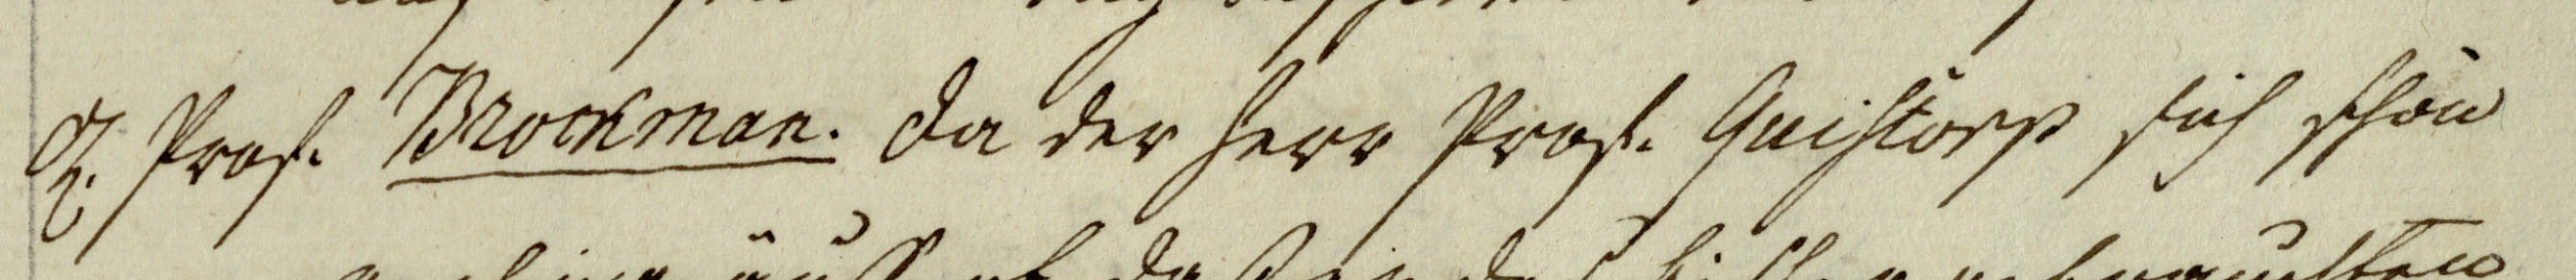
dh. Prof. Brockman. Da der Herr Prof. Quistorp sich schon
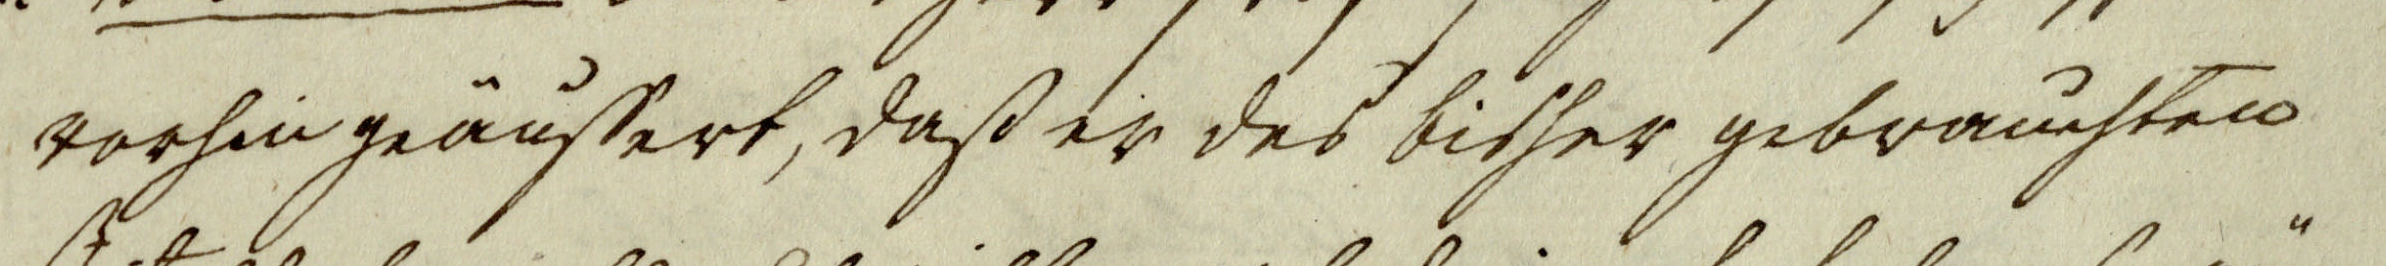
vorhin geäussert, daß er des bisher gebrauchten
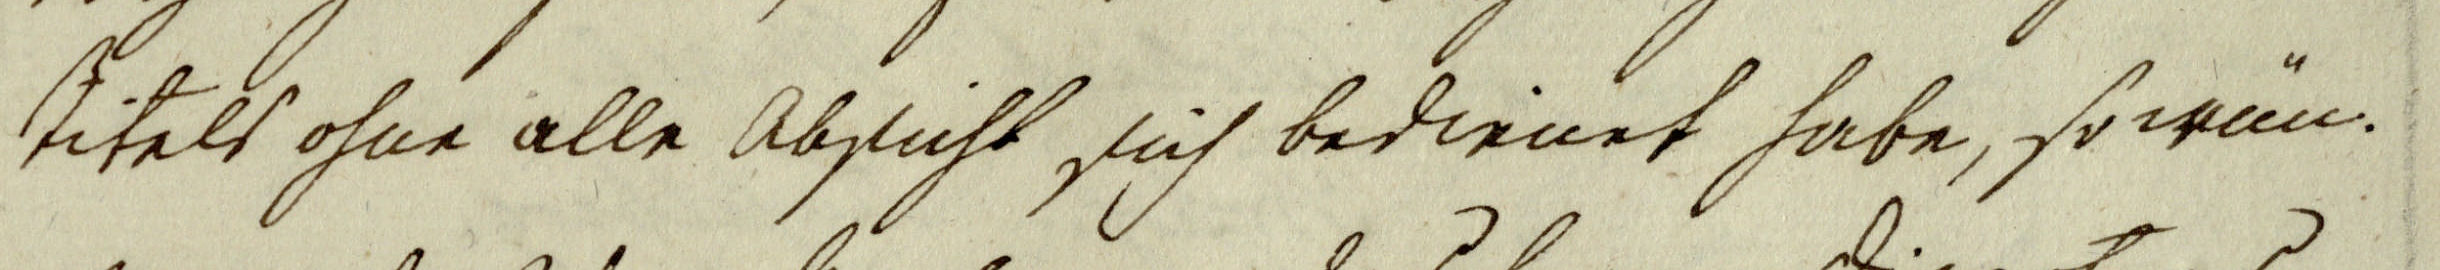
Titels ohne alle Absicht sich bedienet habe, so wün¬
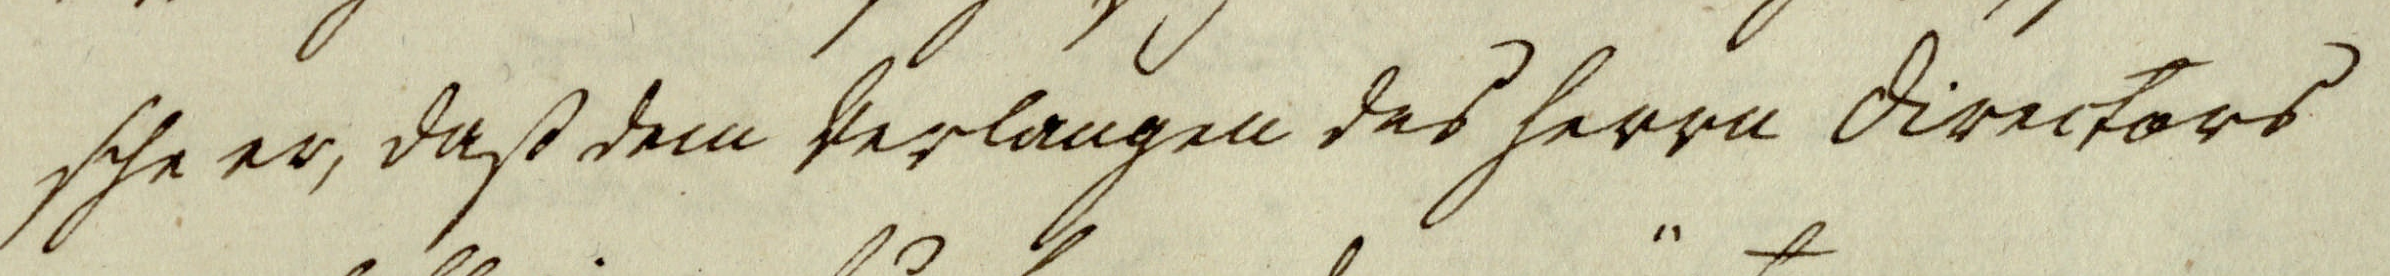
sche er, daß dem Verlangen des Herrn Directors
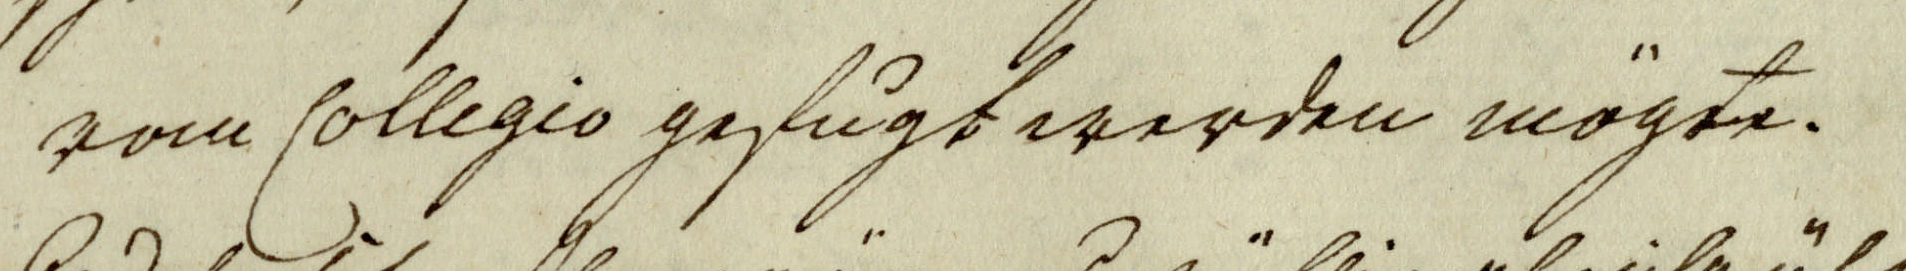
vom Collegio gefugt werden mögte.
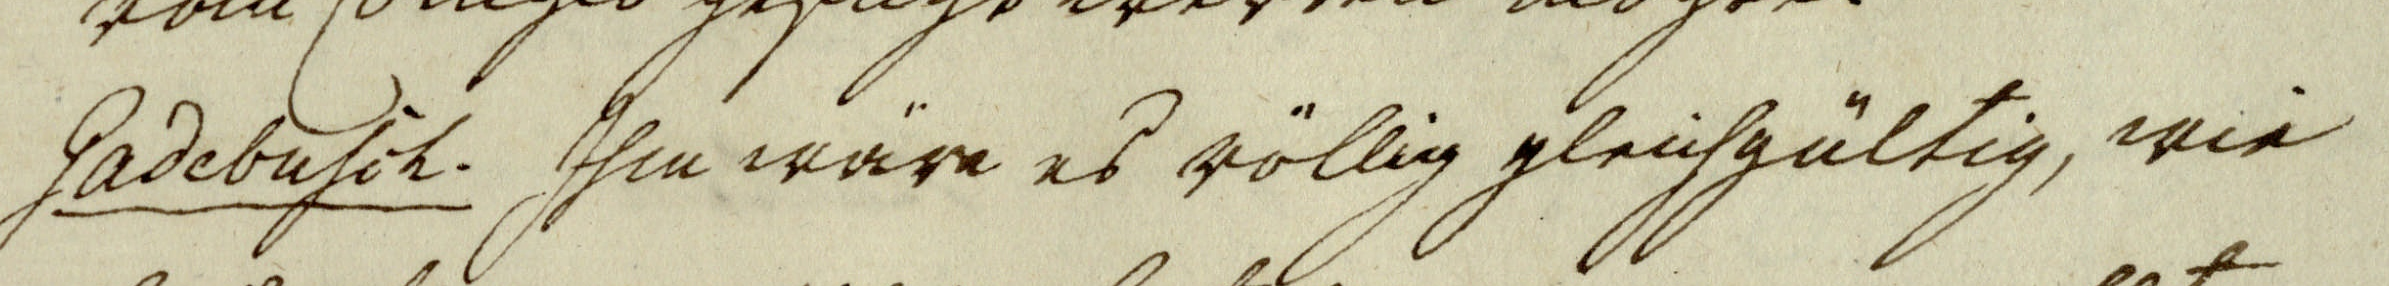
Gadebusch. ihm wäre es völlig gleichgültig, wie
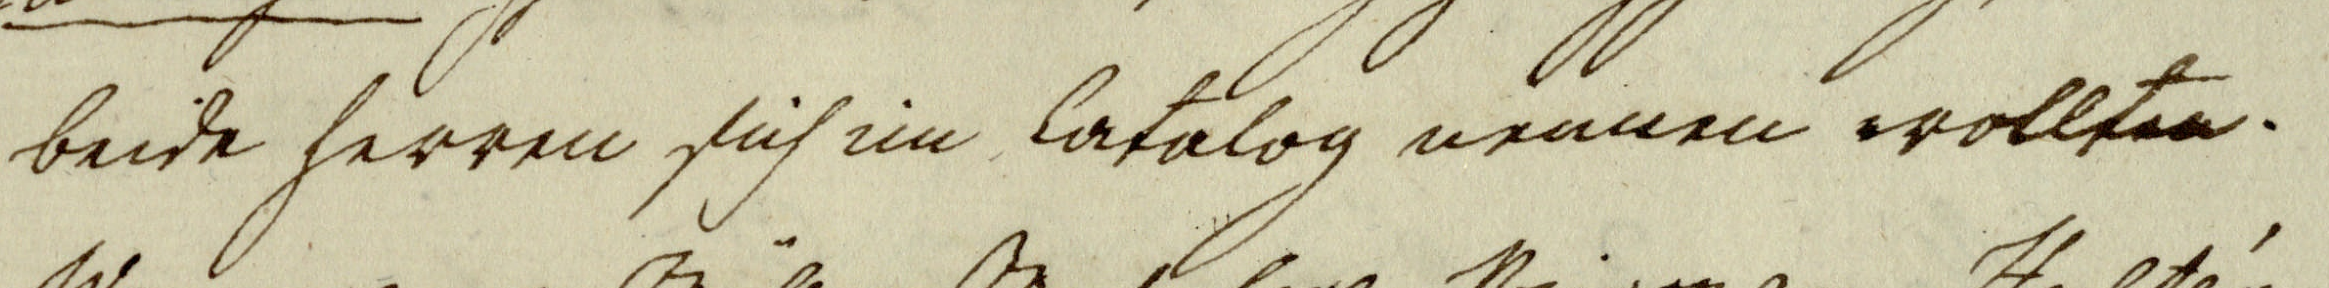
beide Herren sich im Catalog nennen wollten.
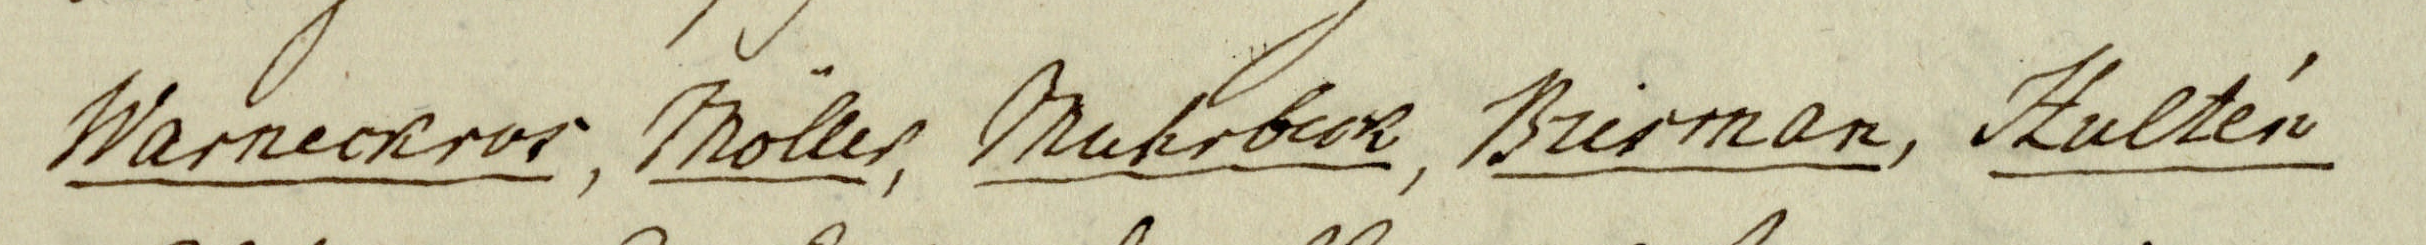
Warneckros, Möller, Muhrbeck Brisman, Hultén
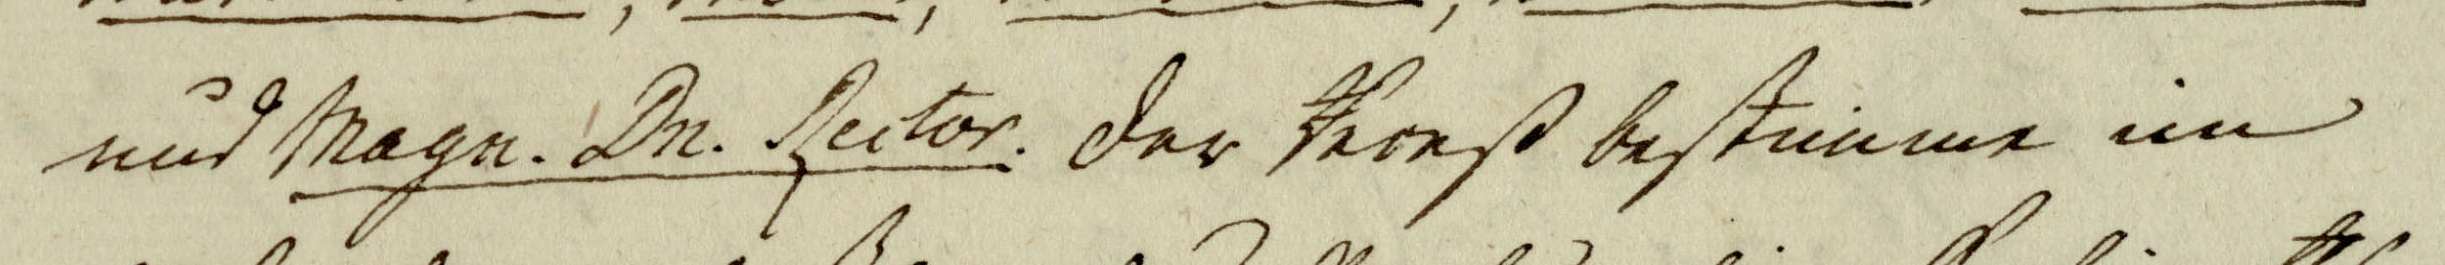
und Magn. Dn. Rector. Der Receß bestimme im
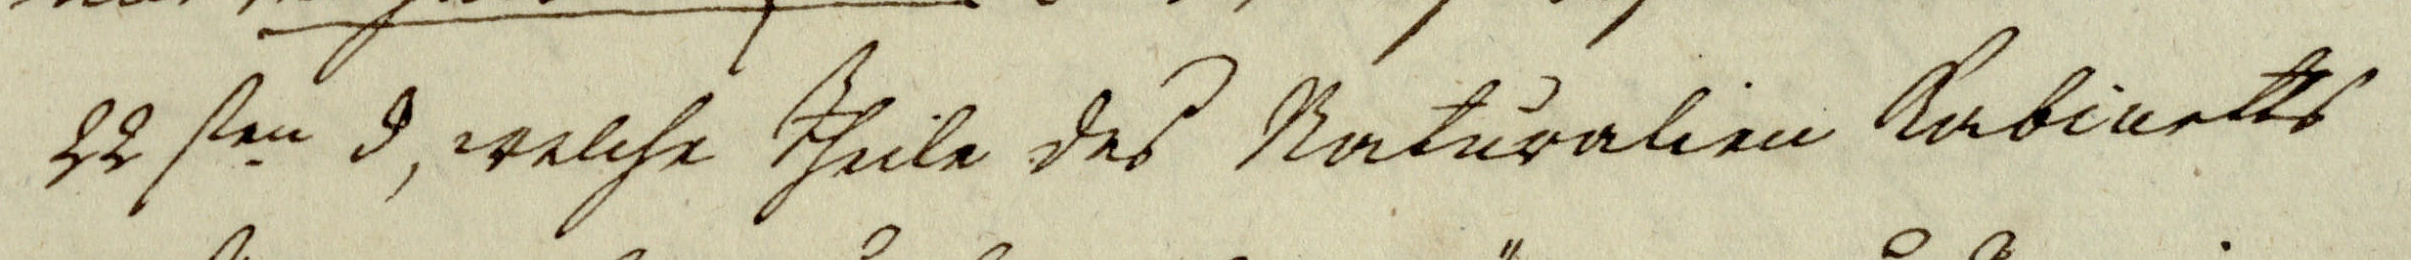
22 ten §, welche Theile des Naturalien Kabinetts
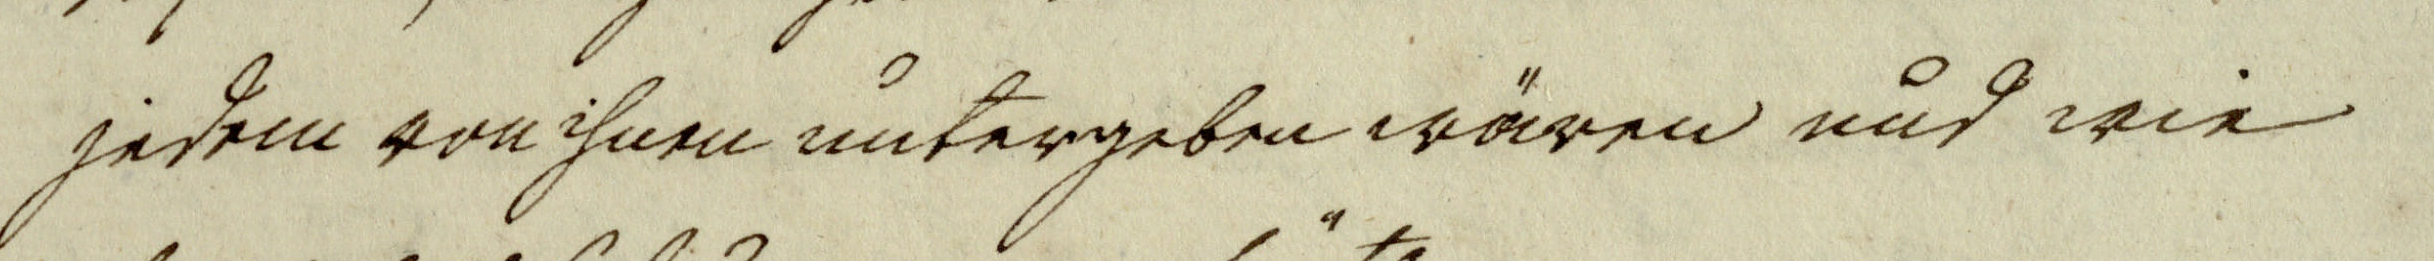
jedem von ihnen untergeben wären, und wie
